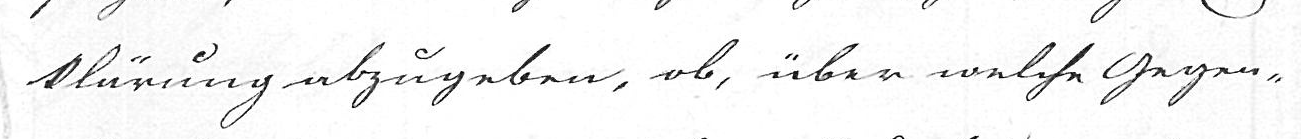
klärung abzugeben, ob, über welche Gegen-
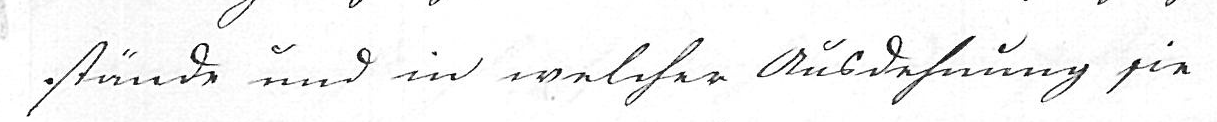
stände und in welcher Ausdehnung sie
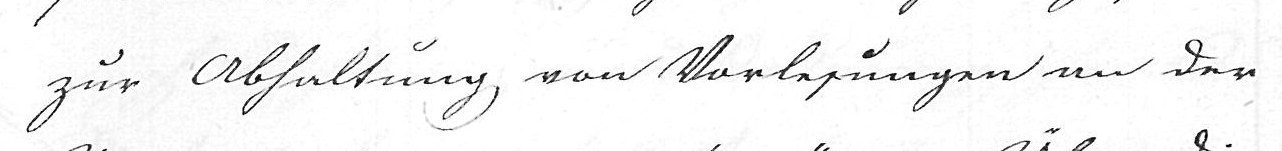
zur Abhaltung von Vorlesungen an der
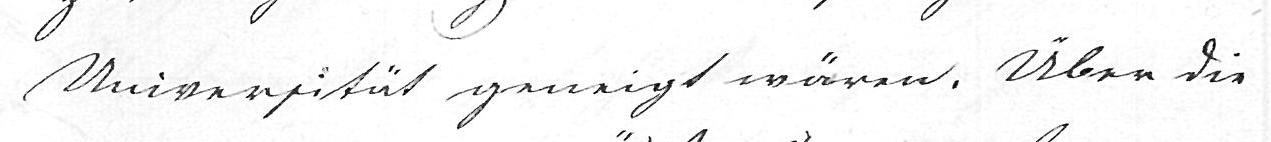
Universität geneigt wären. Über die
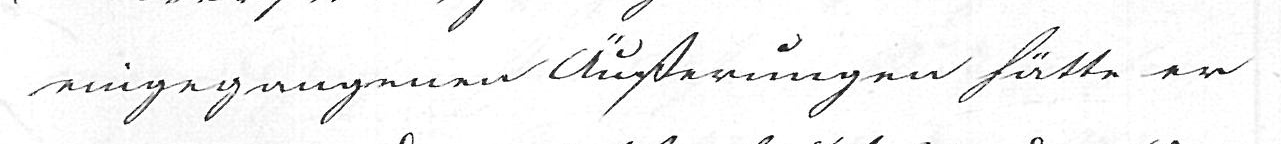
eingegangenen Äußerungen hätte er
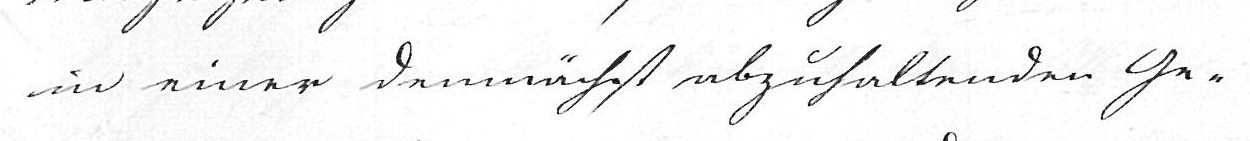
in einer demnächst abzuhaltenden Ge-
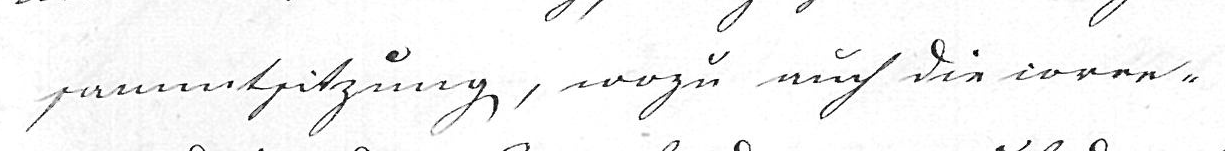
sammtsitzung, wozu auch die corre-
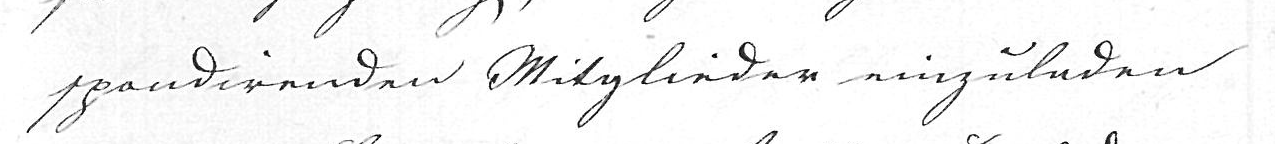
spondirenden Mitglieder einzuladen
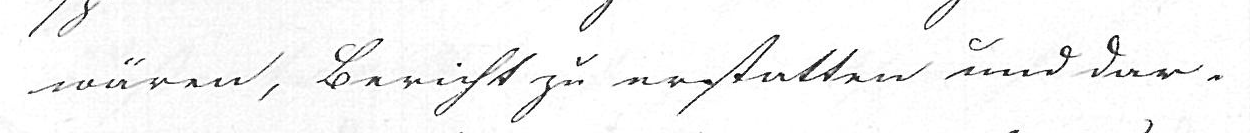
wären, Bericht zu erstatten und dar-
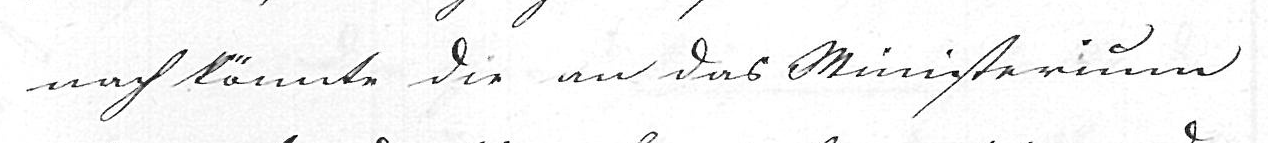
nach könnte die an des Ministerium
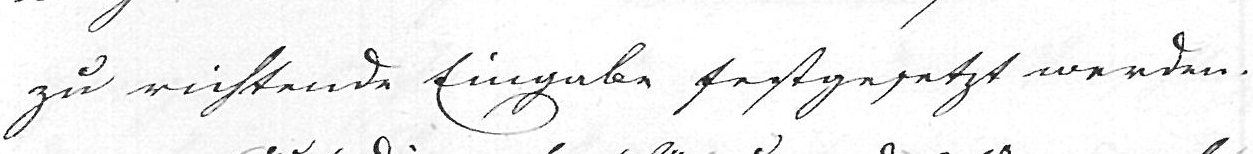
zu richtende Eingabe festgesetzt werden.
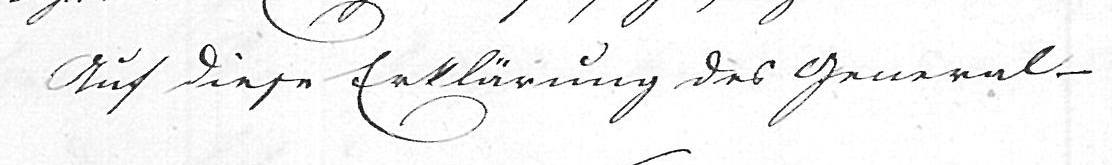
Auf diese Erklärung des General-
